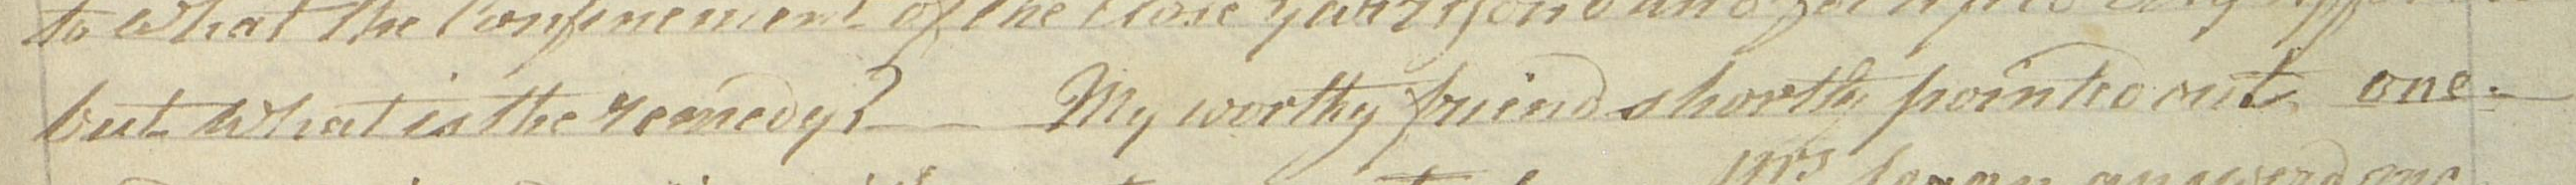but what is the remedy? My worthy friend short pointed out one
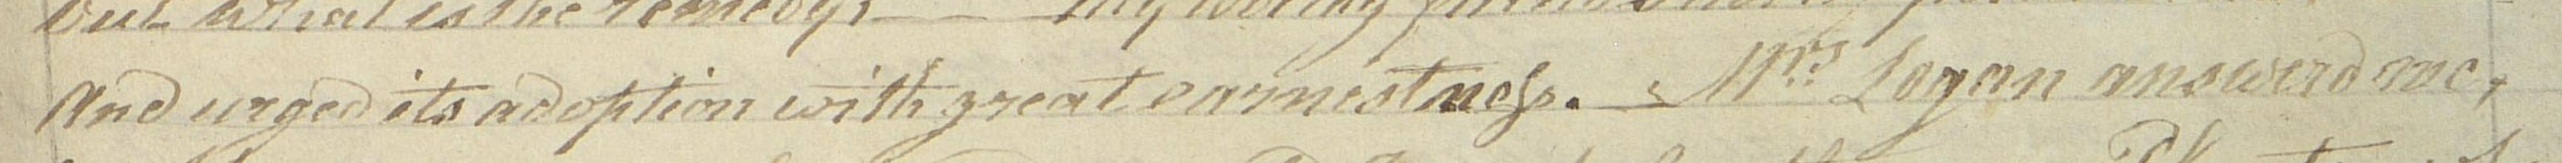And urged its adoption with great earnestness. M^rs. Logan answerd me,
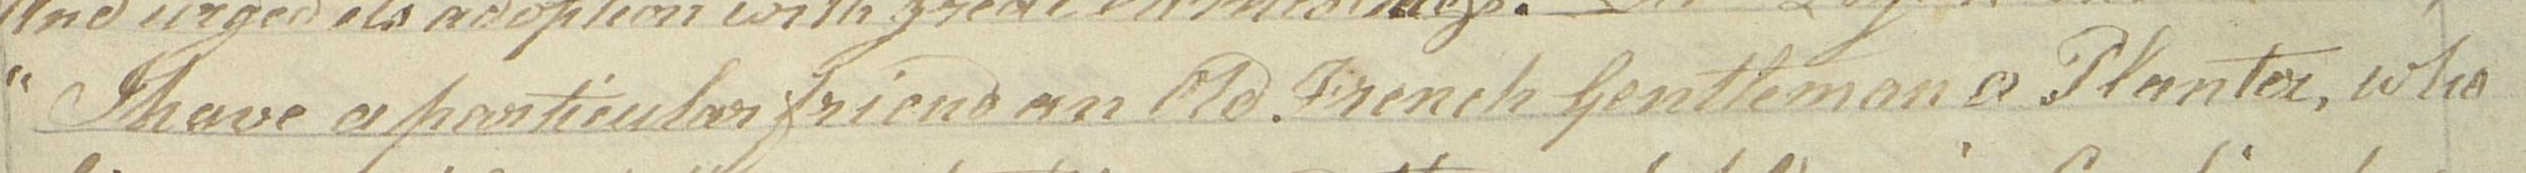"I have a particular friend an Old French Gentleman a Planter, who
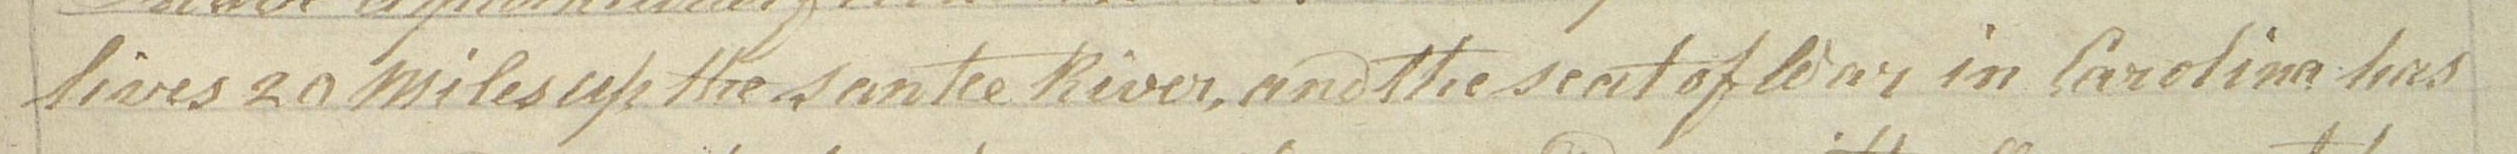lives 20 Miles up the sante River, and the seat of War in Carolina has
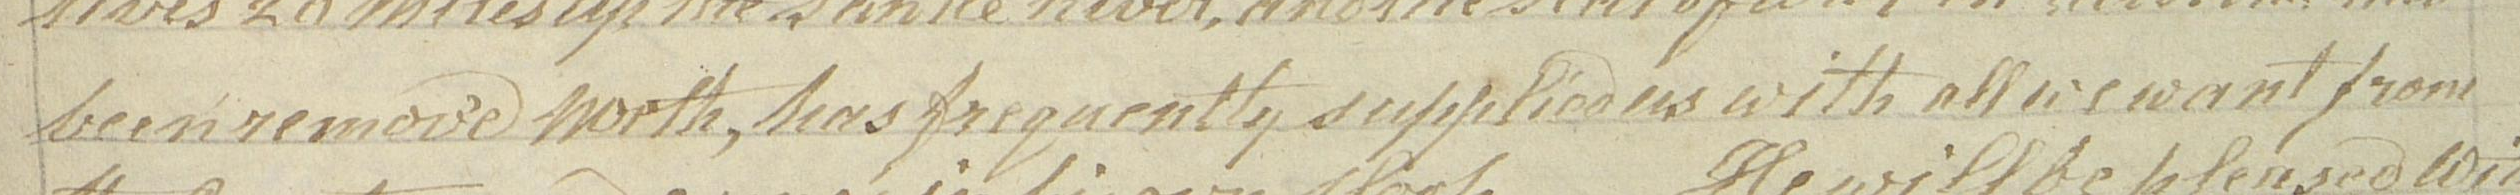been removed North, has frequently supplied us with all we want from
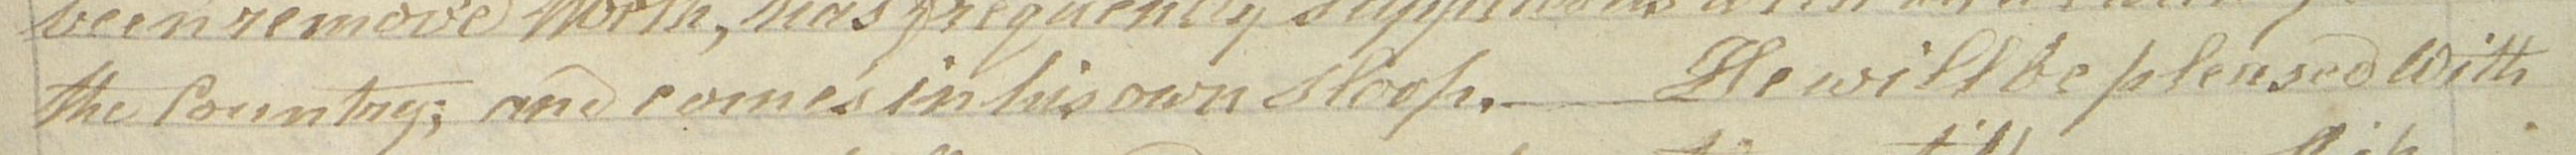the Country; and comes in his own sloop. He will be pleased With
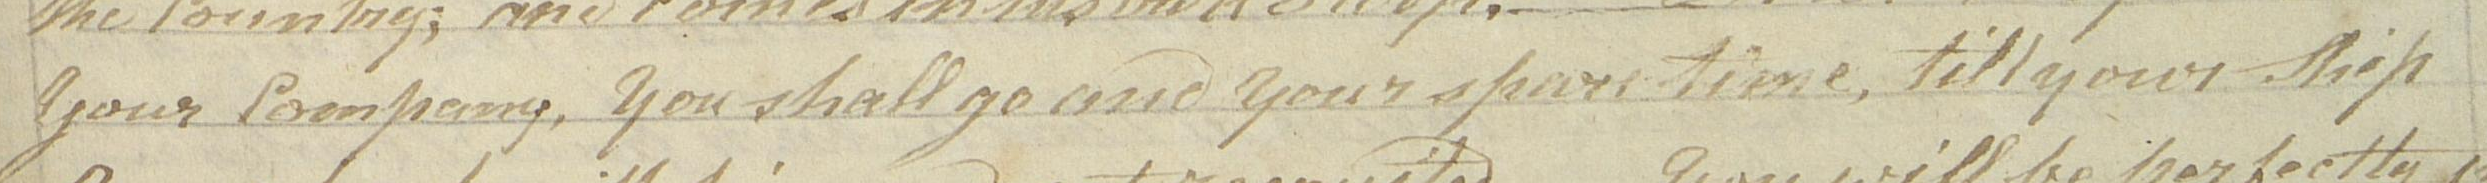Your Company, You shall go and your spare time, till your Ship
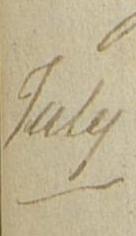July
